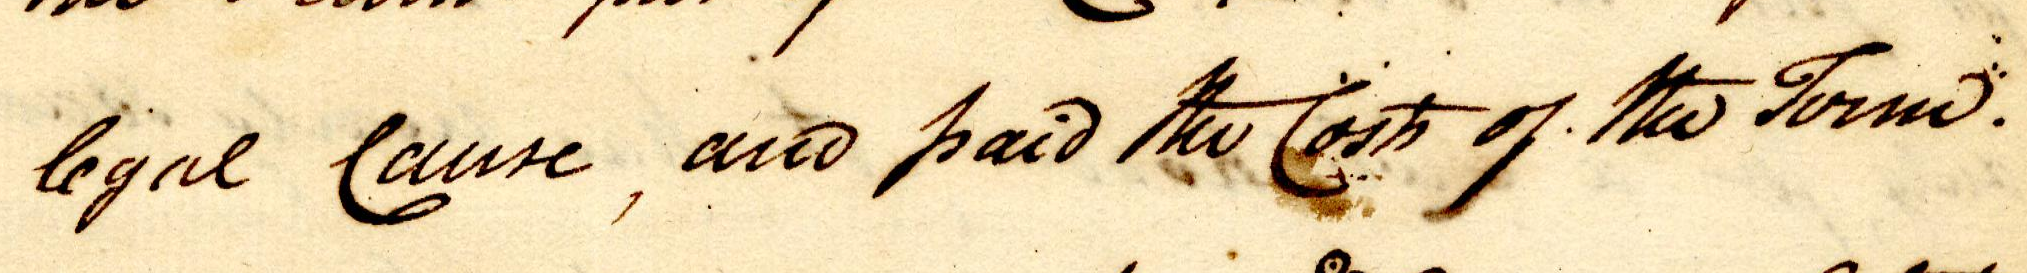legal Cause and paid the Costs of the Form.
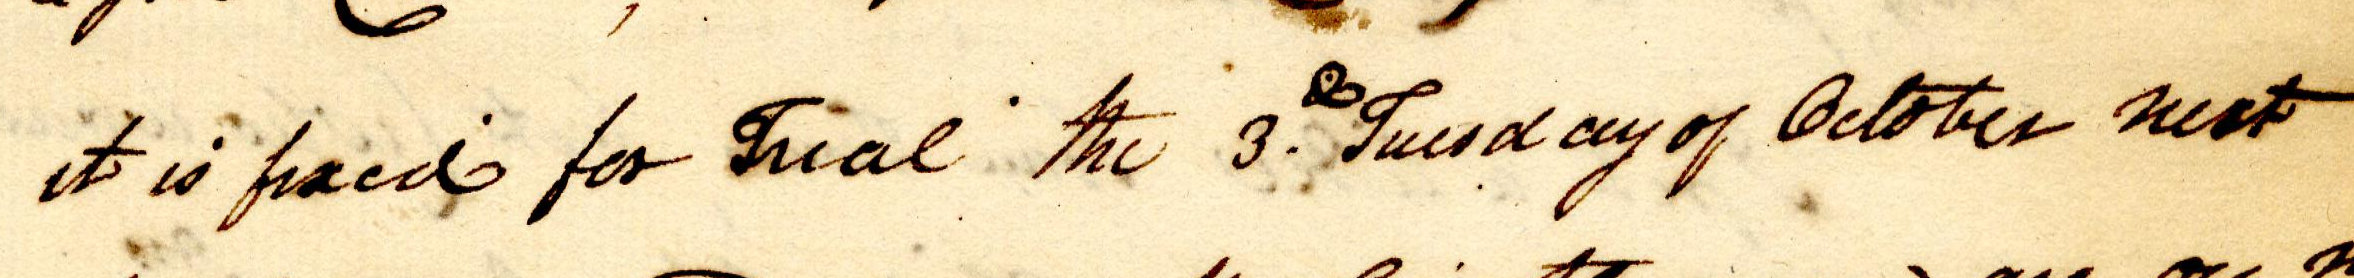it is fixed for Trial the 3^d. Tuesday of October next
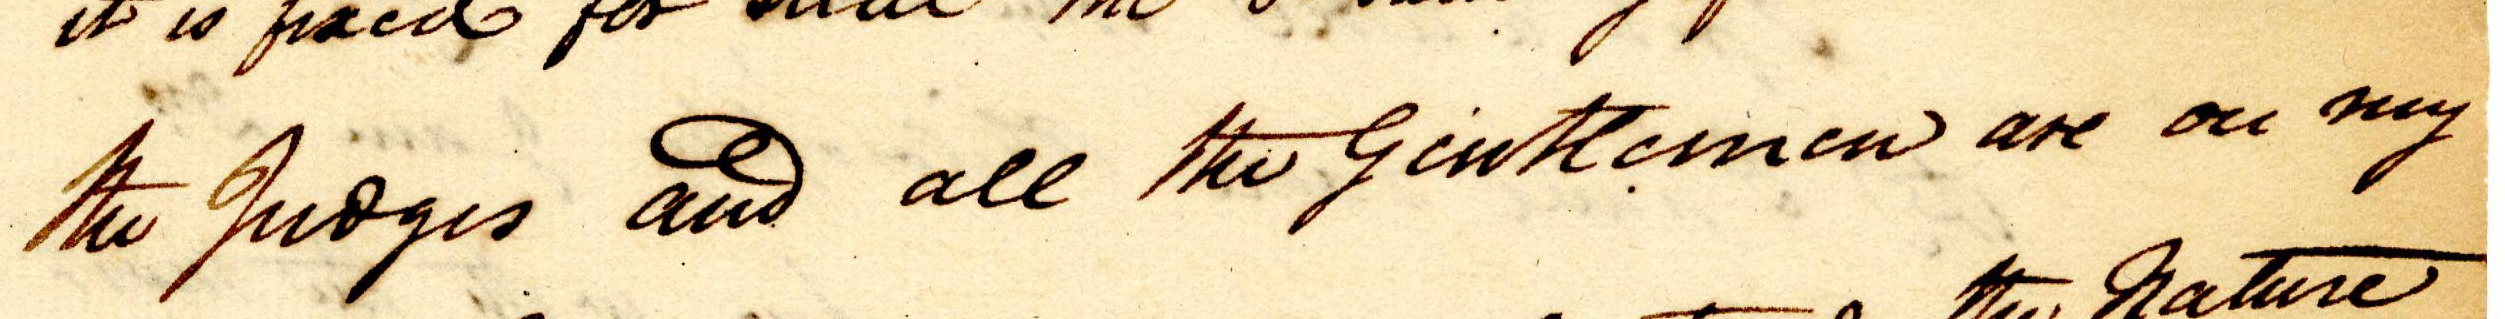the Judges and all the Gentlemen are on my
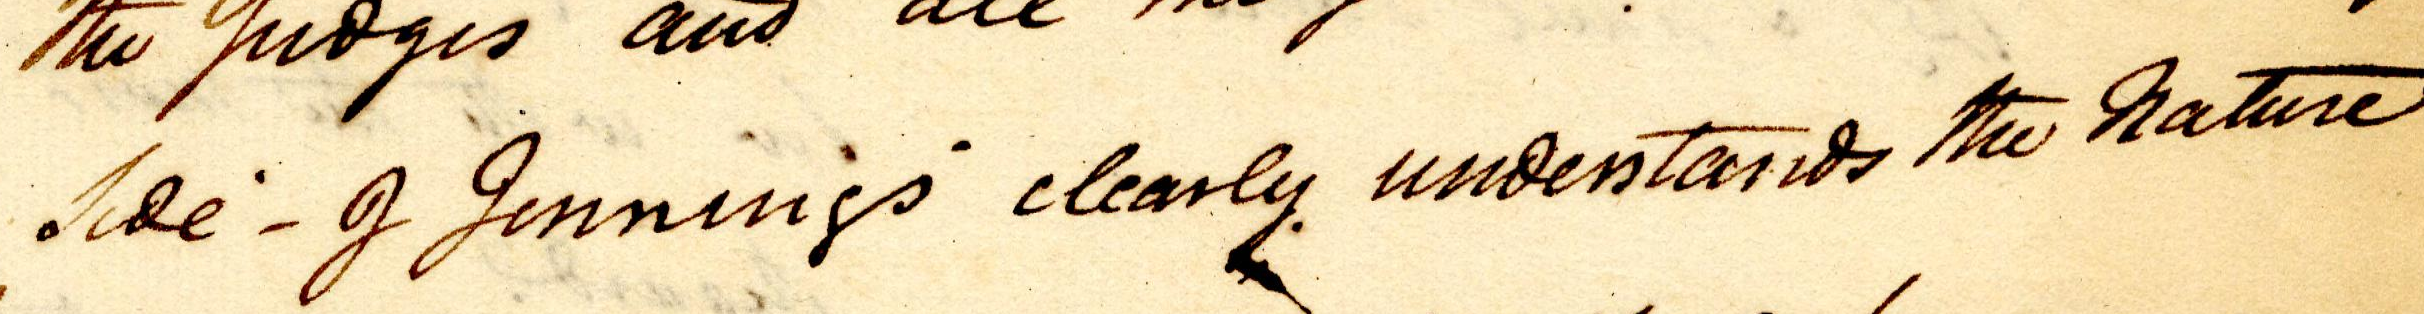side- J. Jennings clearly under stands the Nature
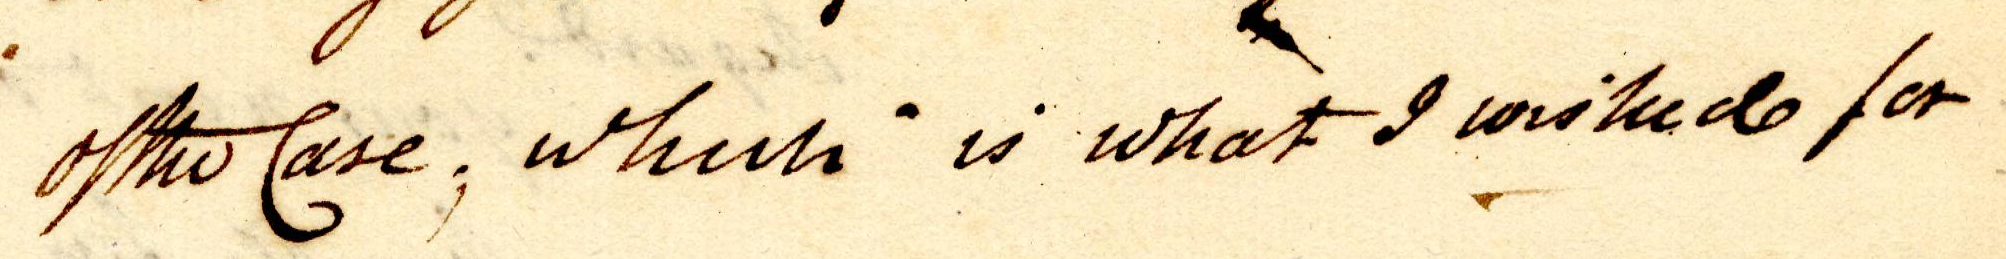of the Case; which is what I wished for
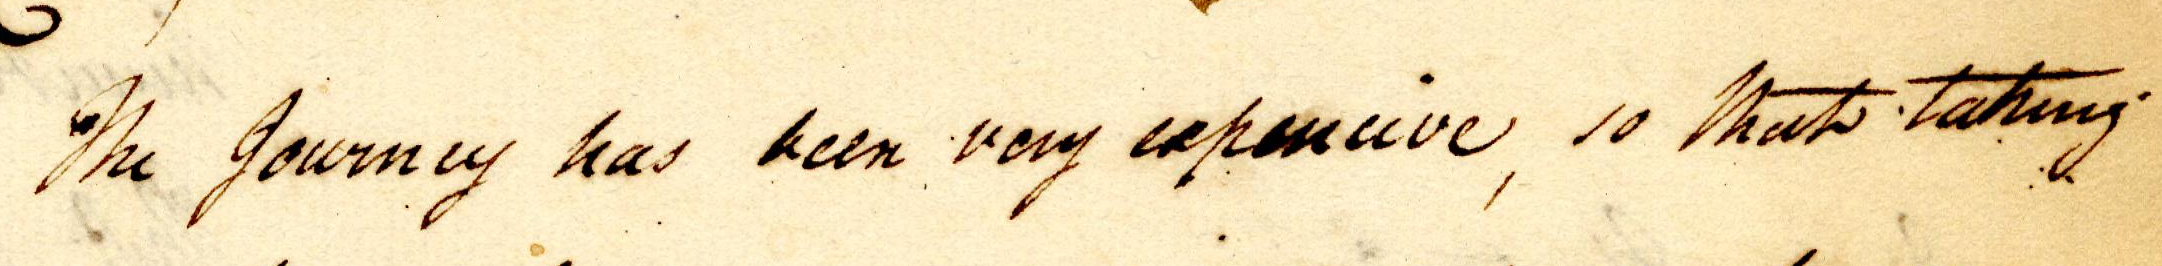The Journey has been very expensive so that taking
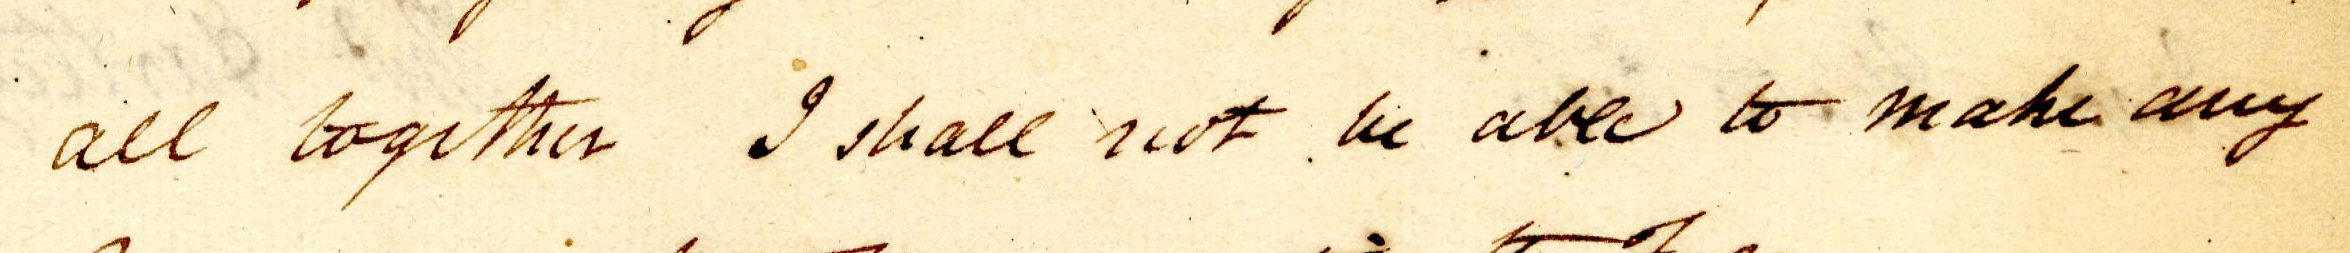all together I shall not be able to make any
